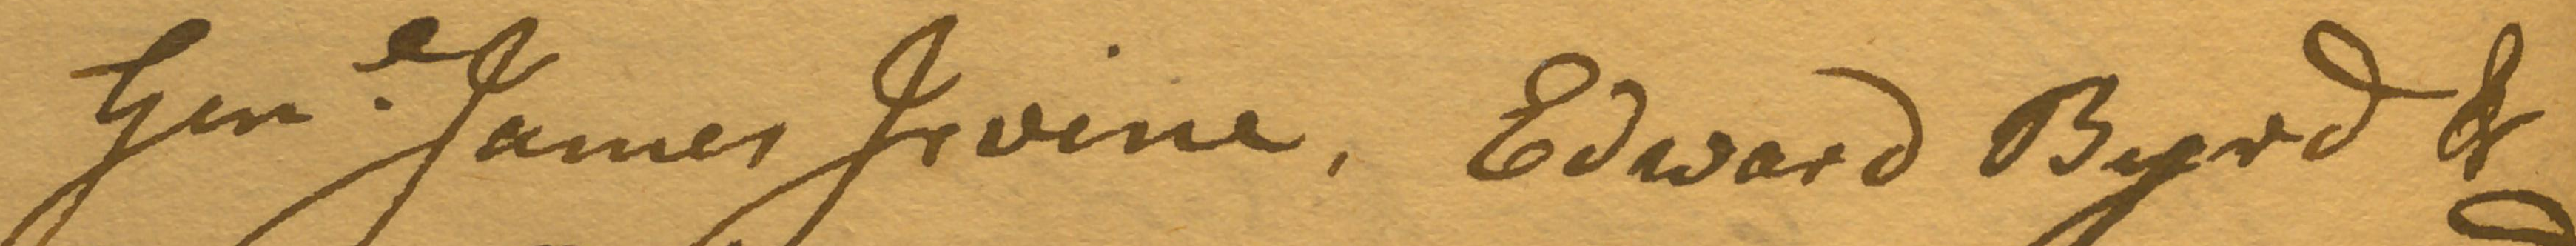Gen^l. James Irvine, Edward Byrd &
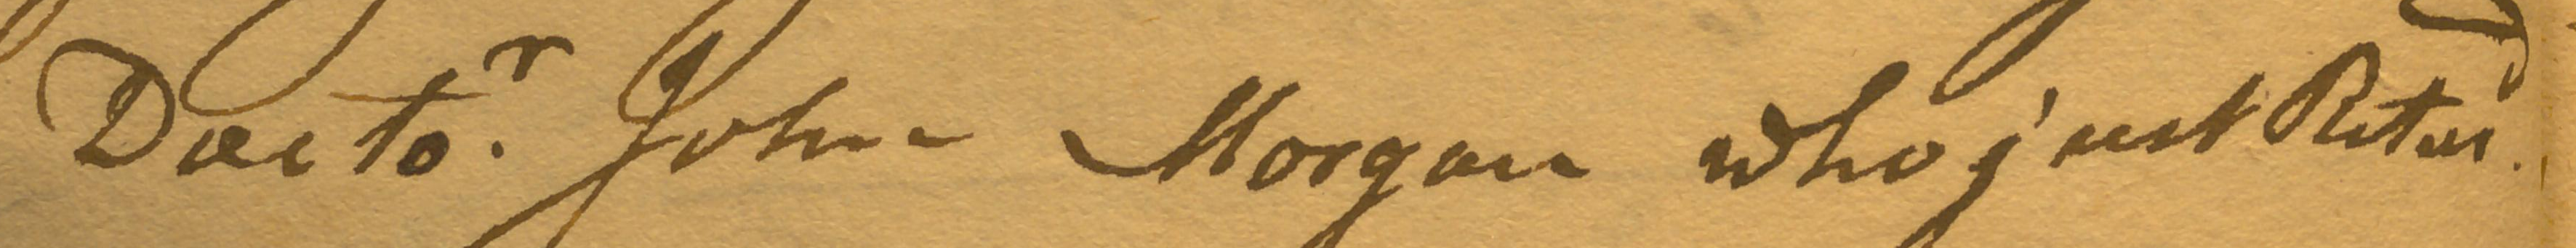Docto^r. Joh Morgan who just Retur^d.
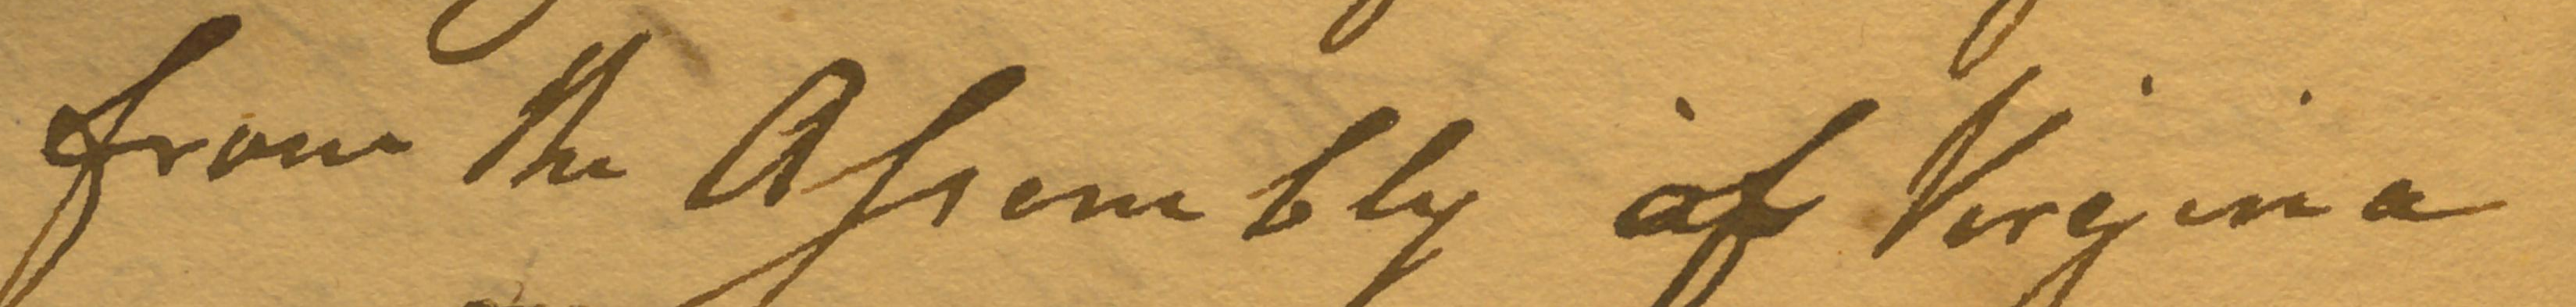from the Assembly of Virgina
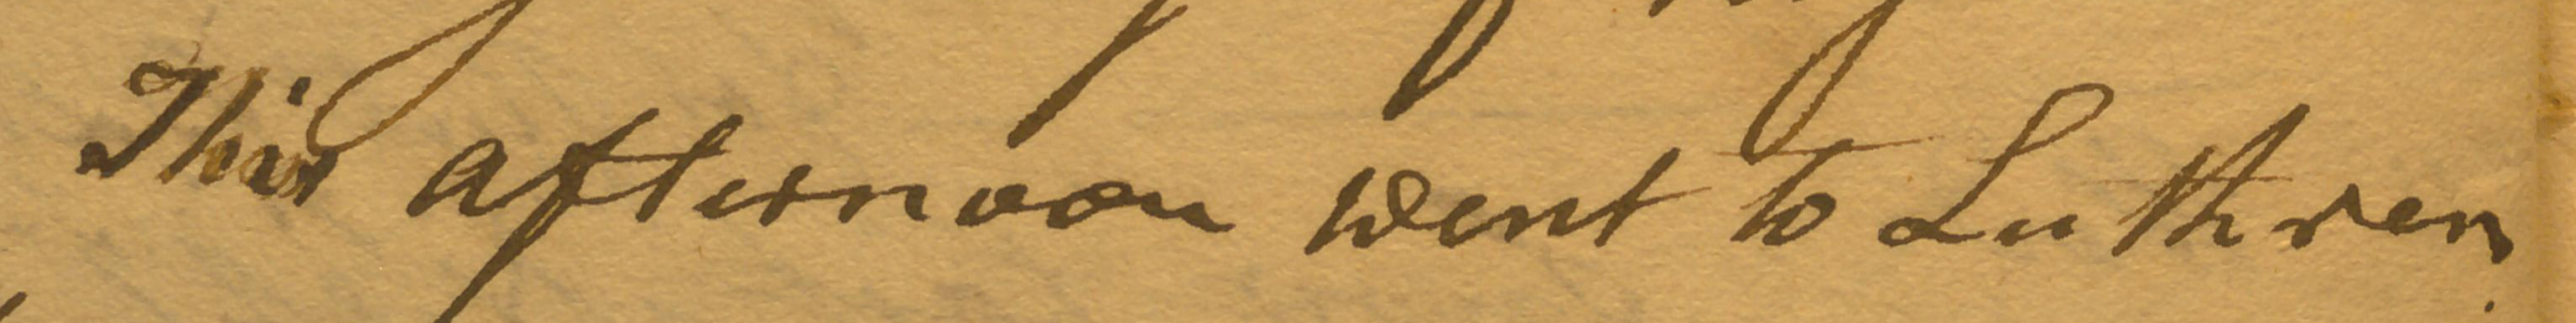This afternoon went to Luthren
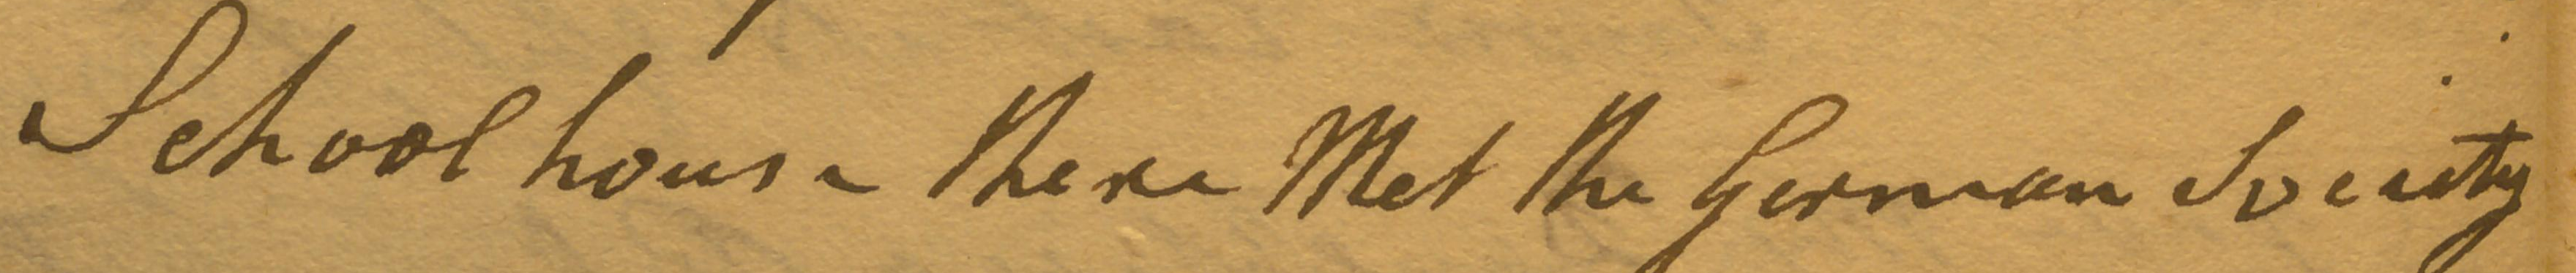Schoolhouse there Met the German Society
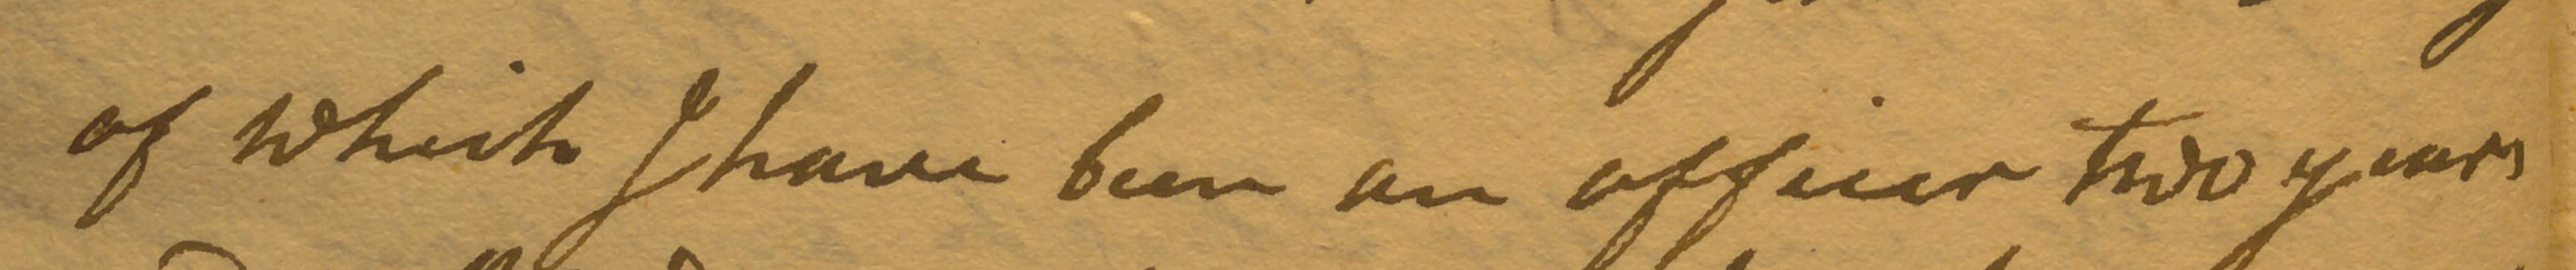of which I have been an officer two years
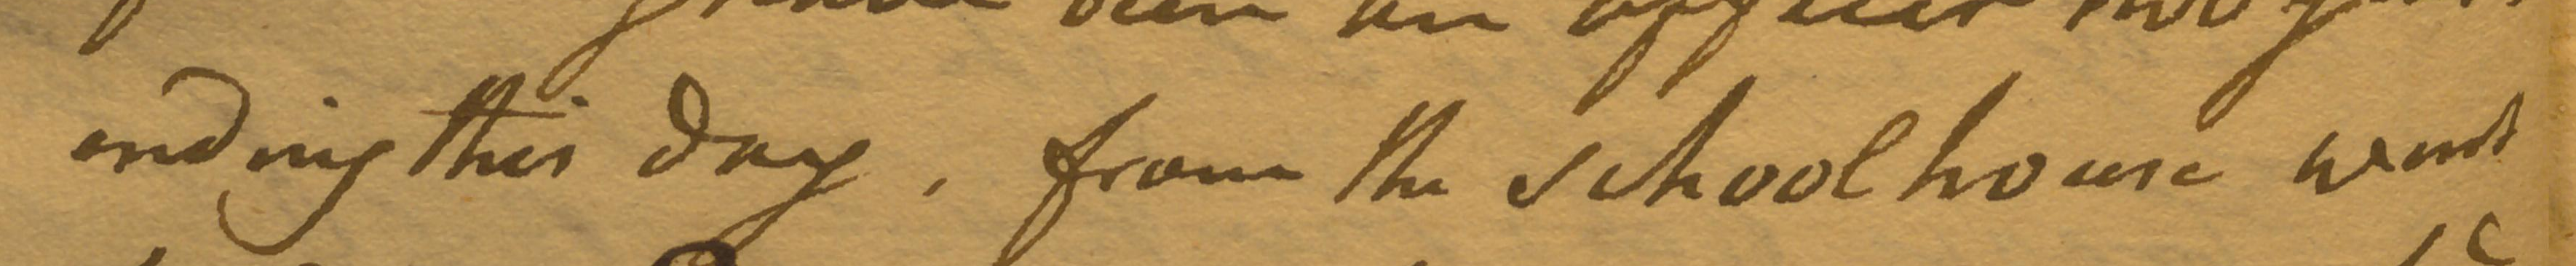ending this day from the school house went
